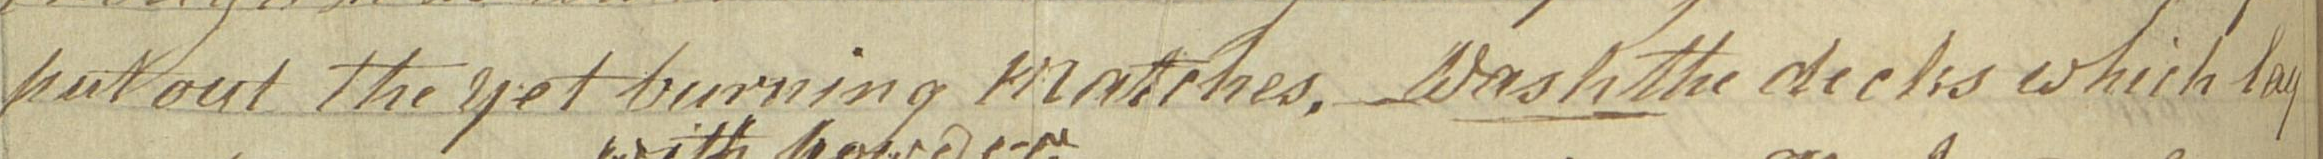put out the yet burning Matches, Wash the decks which lay
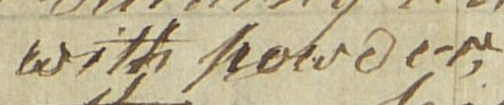with powder
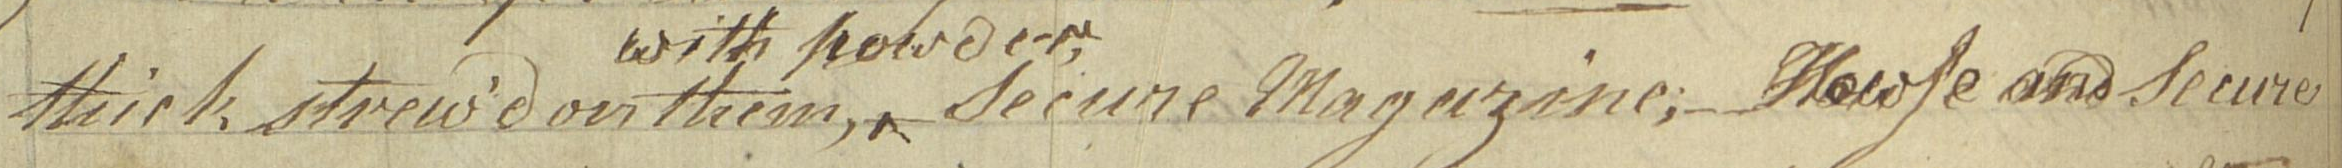thick strew'd our them, ^ Secure Magazine; Howse and Secure
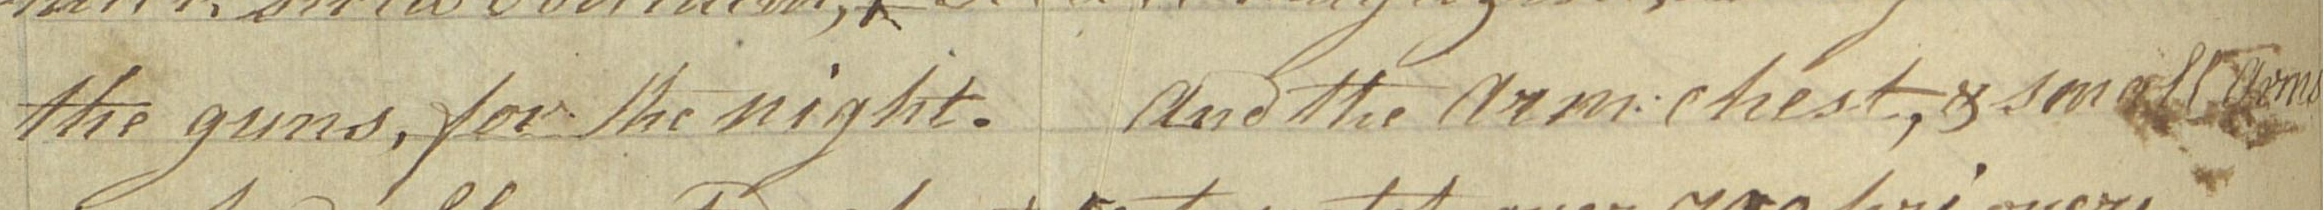the guns for the night. And the armchest, & small Arms.
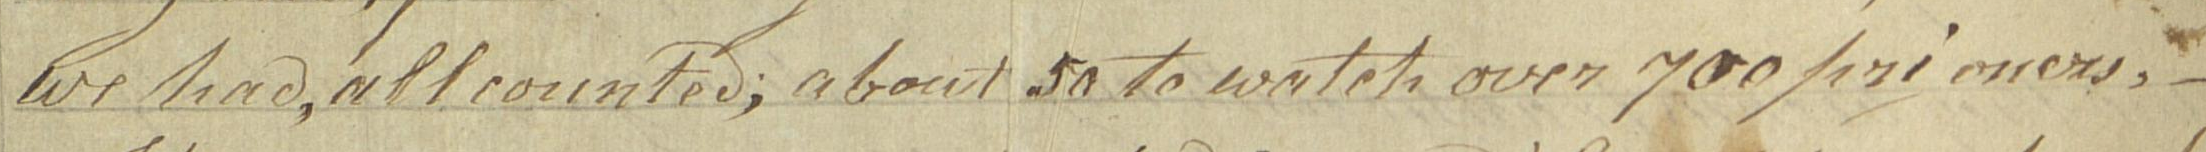We had, all counted; about 50 to watch over 700 prioners.
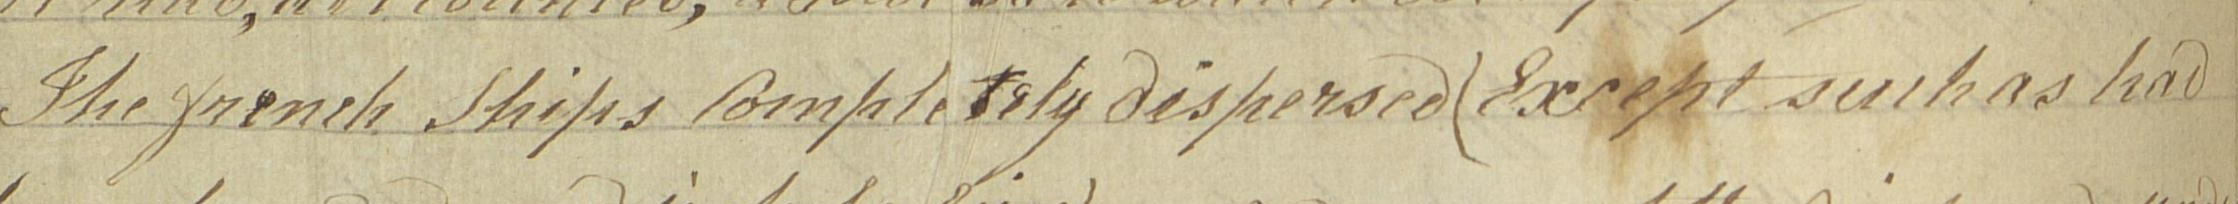The french Ships Completely dispersed (Except such as had
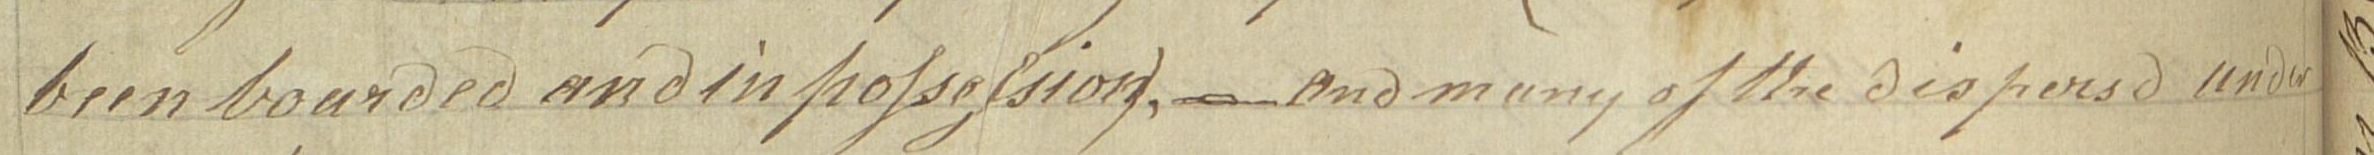been boarded and in possession), and many of the dispersd under
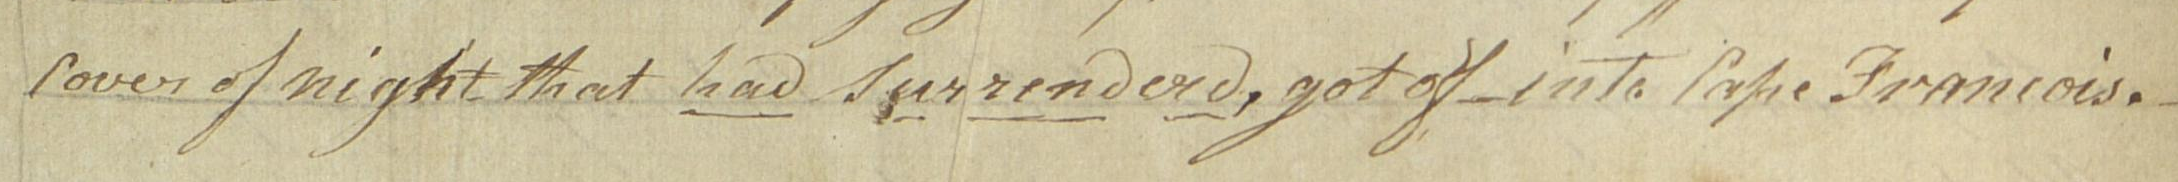cover of night that had surrenderd, got of into Cape Francois.
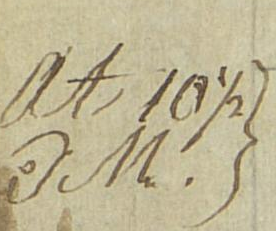At 10 1/2
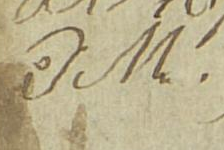PM
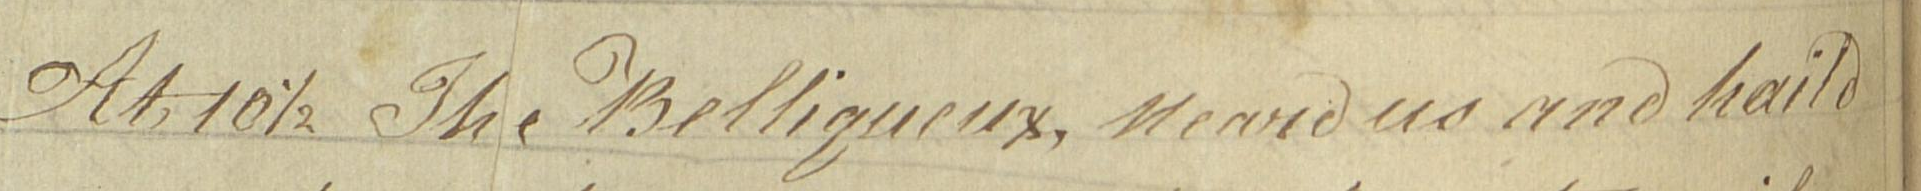At 10 1/2 The Belliqueux, heard us and haild
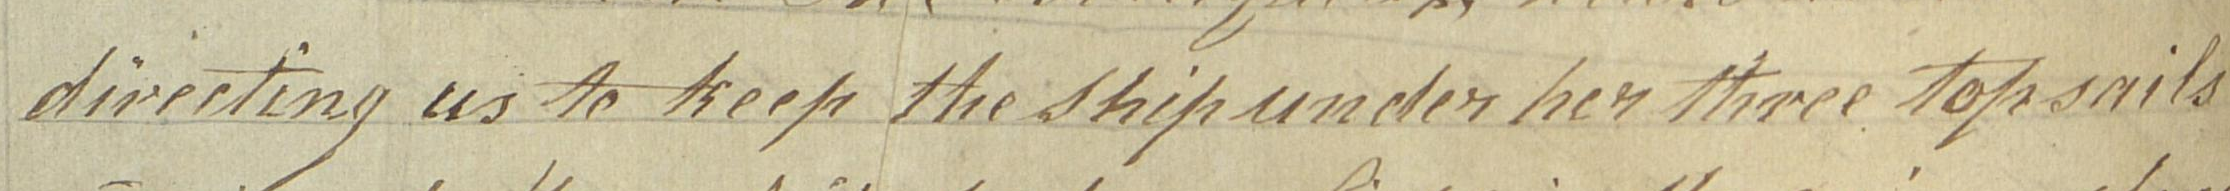directing us to keep the ship under her three topsails
